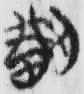荊（荆）
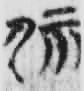𫵖
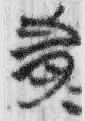之月
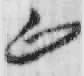㠯（以）
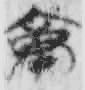○（就）
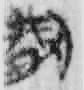荊（荆）
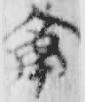○（就）
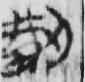荊（荆）
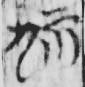𫵖
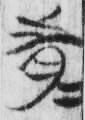之月
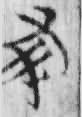○（盡）
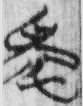○（卒）
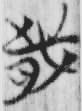歲（歲）
